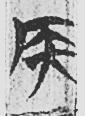侯
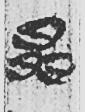晶
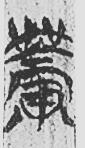{亠舛車}
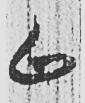㠯（以）
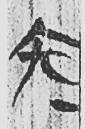內
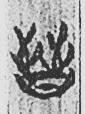晉
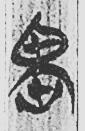{鬼山}
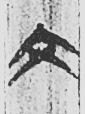文
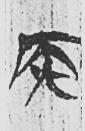侯
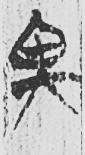𢍉
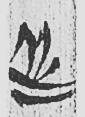從
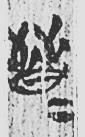晉=
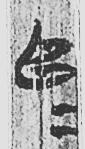𠂤=
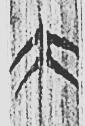大
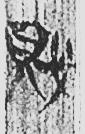{貝戈}
